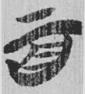百
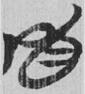眚（姓）
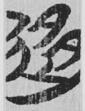迻（移）
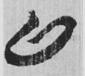㠯（以）
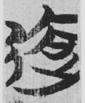○（去）
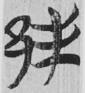邦
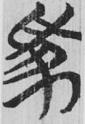家
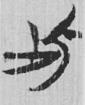此
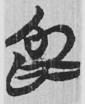爲
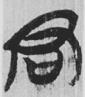君
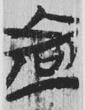者
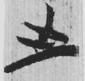之
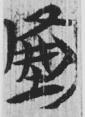○（刑）
